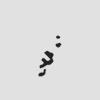畜
